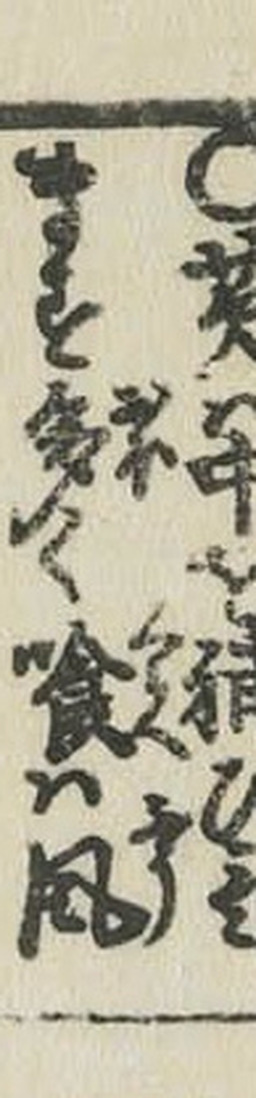ます多く喰は風
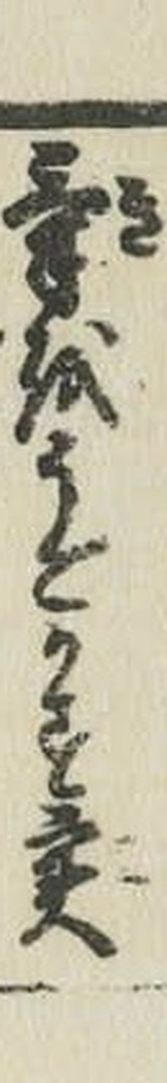気をうごかす実
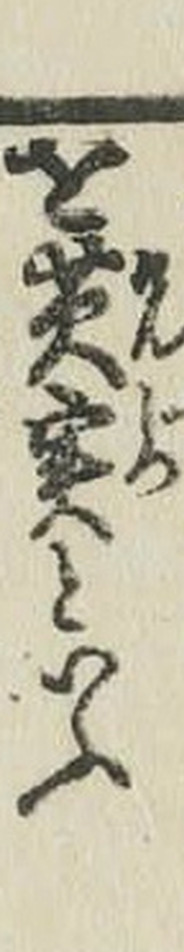を芡実といふ
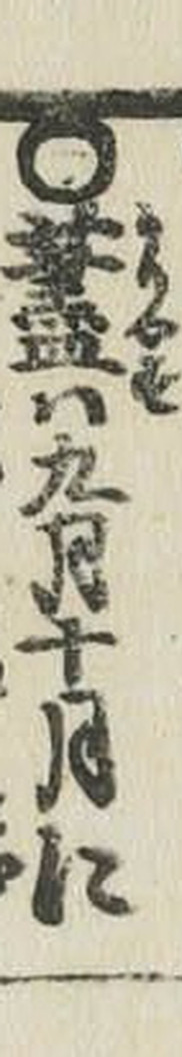○藎は九月十月に
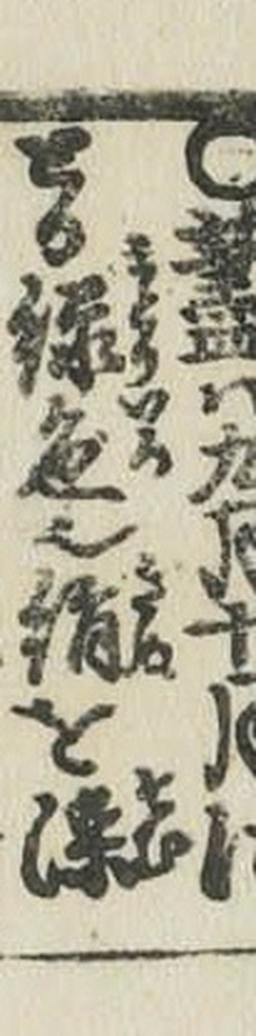とる緑色也絹を染
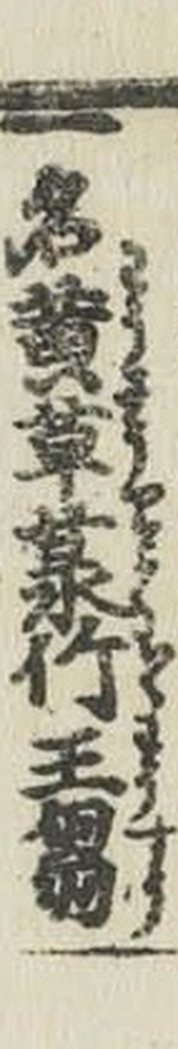一名黄草菉竹王芻
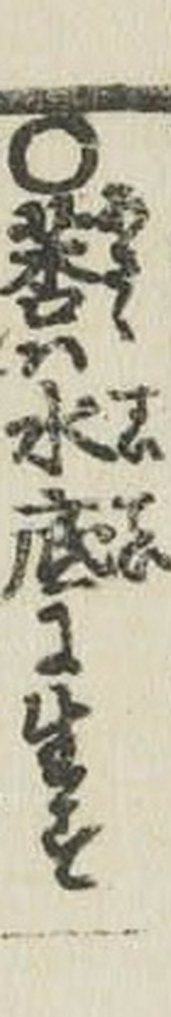○莕は水底に生す
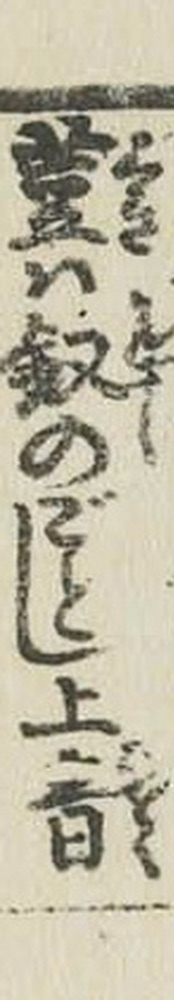茎は釵のごとし上青
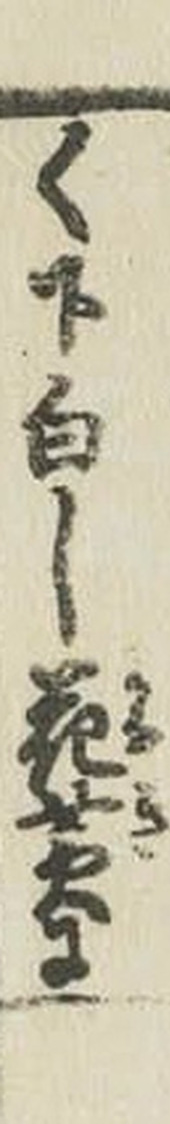く下白し花黄に
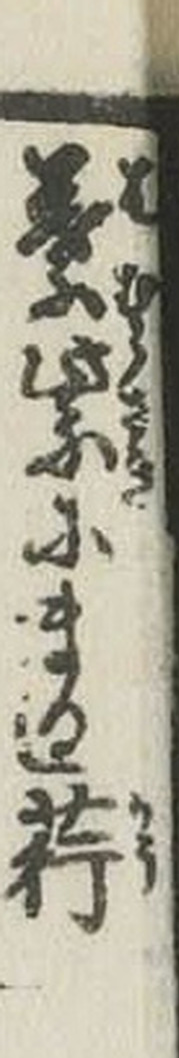葉紫にまるし荇
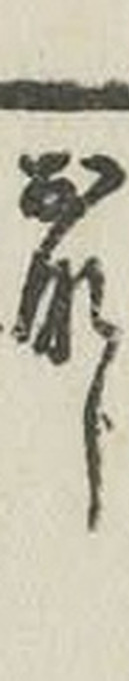おなじ
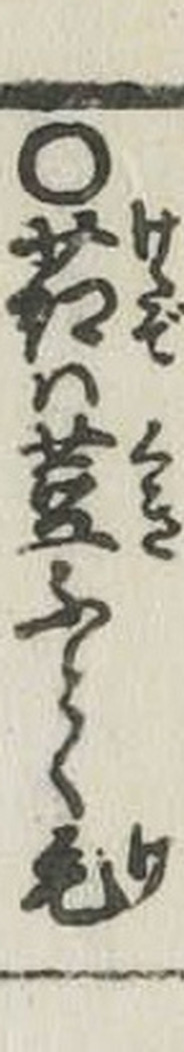○葒は茎ふとく毛
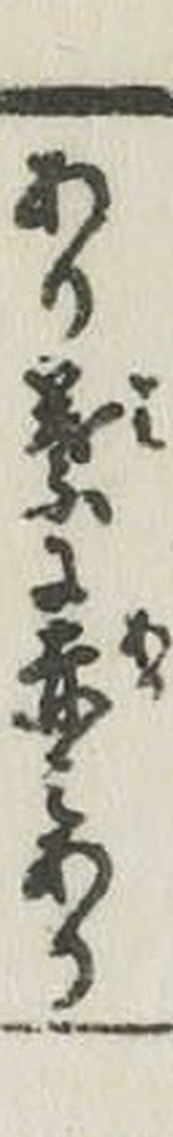あり葉に赤みあり
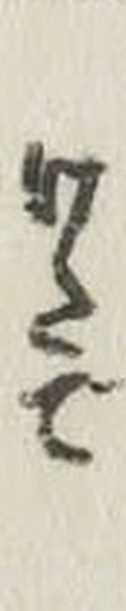けたで
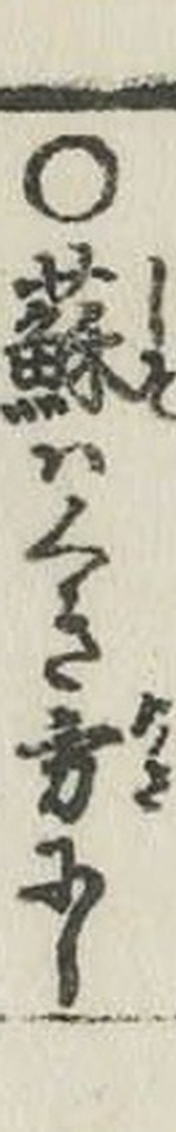○蘇はくき方にし
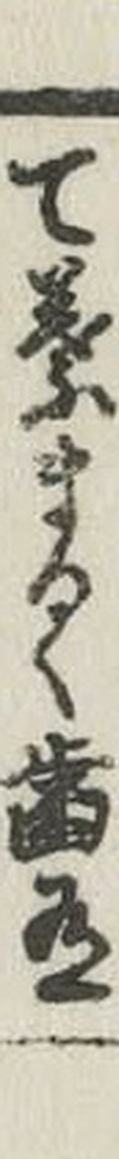て葉まるく歯有
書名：増補頭書訓蒙図彙大成 10巻 9:巻之20
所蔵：東京学芸大学教育コンテンツアーカイブ
